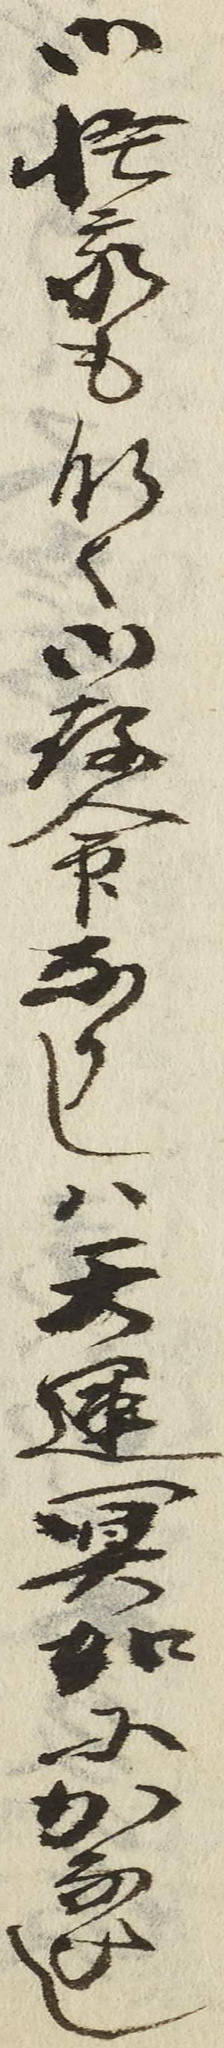御怪我もなく御存命なりしは天運冥加にかないし
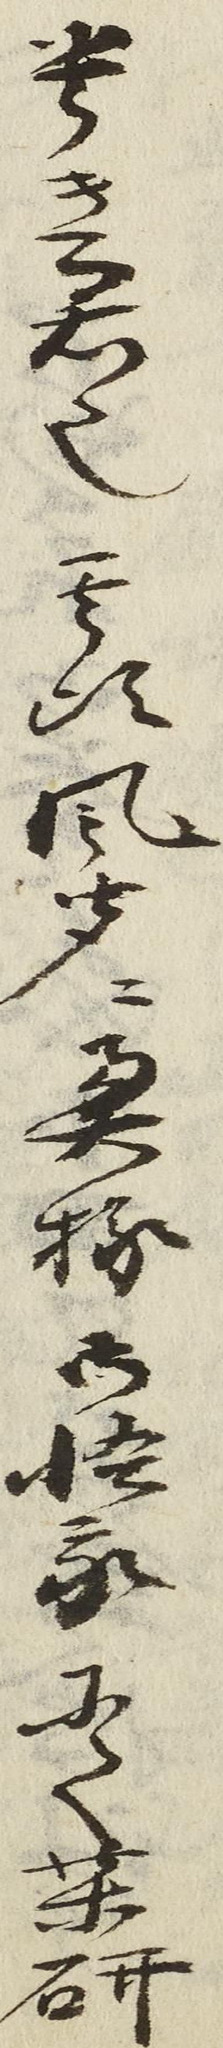貴き君也其頃風聞ニ奥様御怪我にて薬研
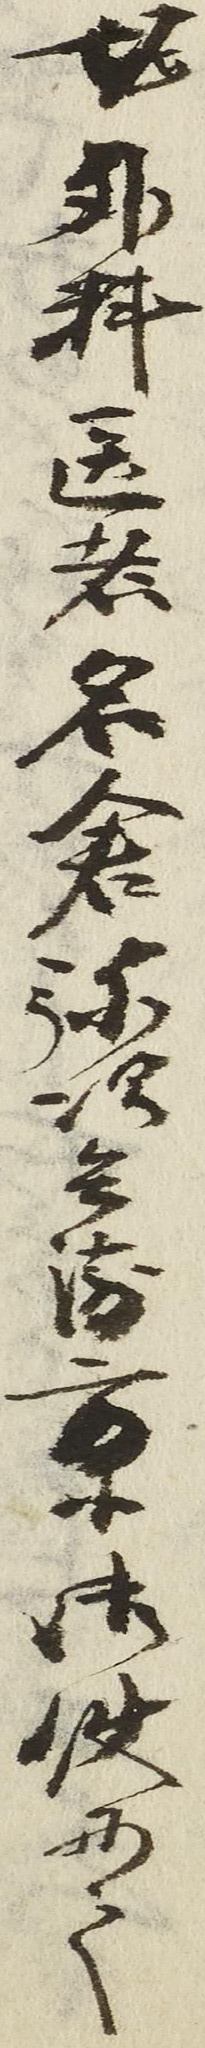堀外料医者名倉弥次兵衛方に御使にて
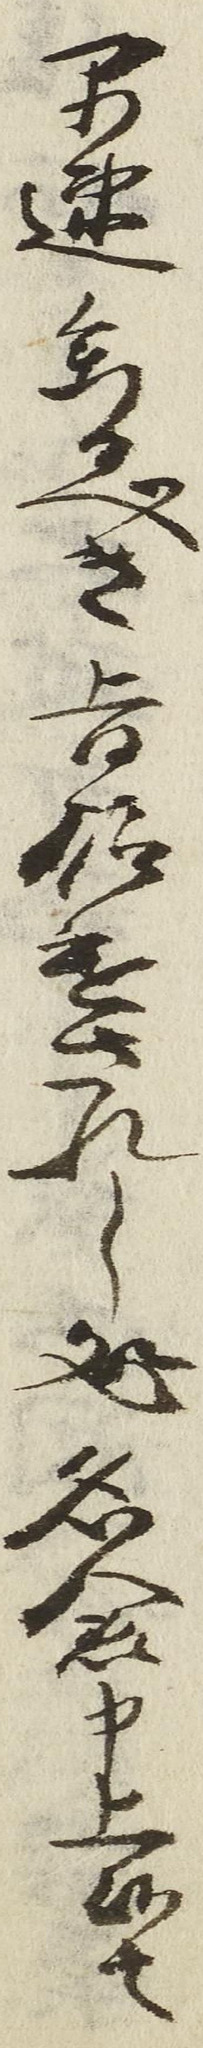早速参るべき旨仰遣されし処名倉申上候は
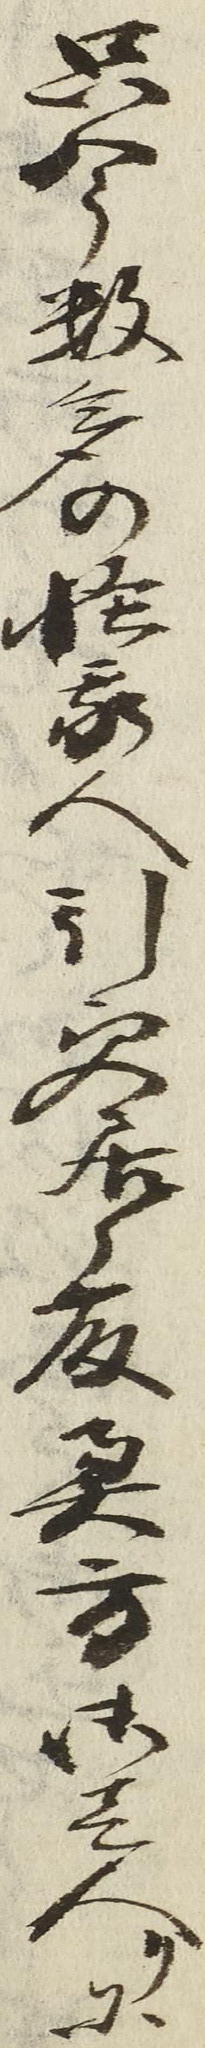只今数多の怪我人引受居候故奥方御壱人りに
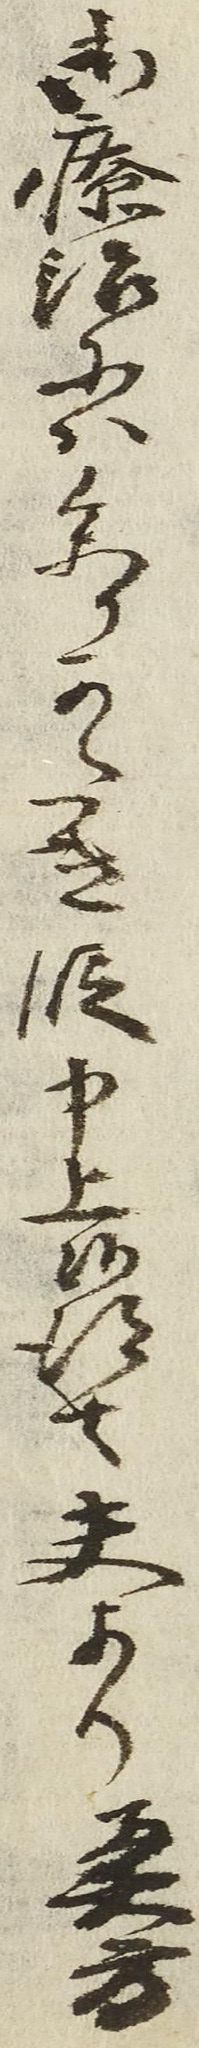御療治には参りかたき段申上候得は夫より奥方
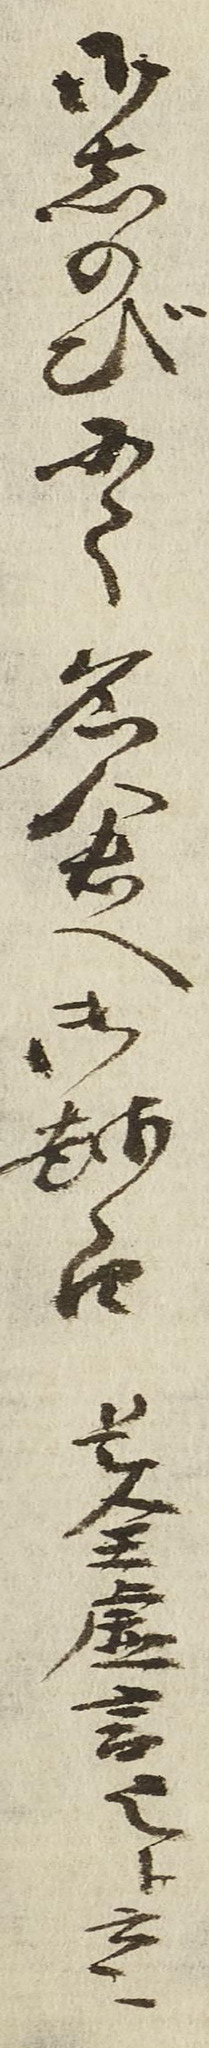御しのびにて名倉へ御越候由是全虚言也ト云々
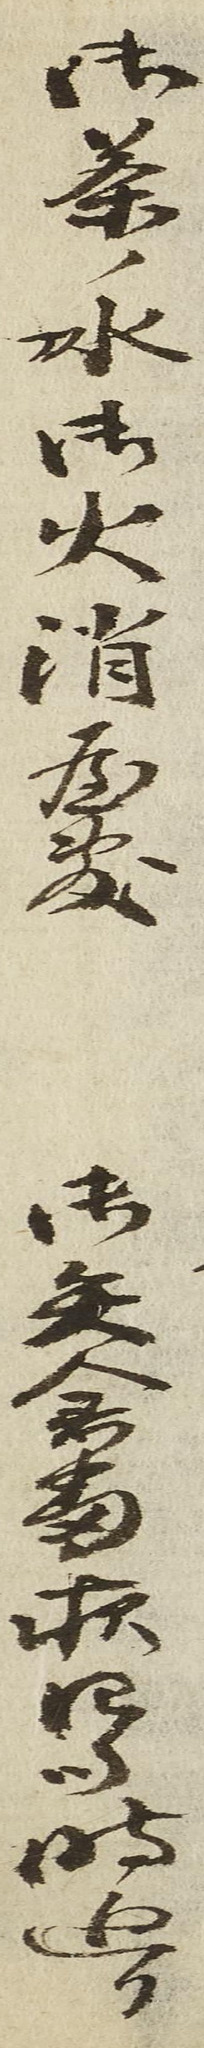御茶ノ水御火消屋敷御矢倉番夜四ツ時廻り
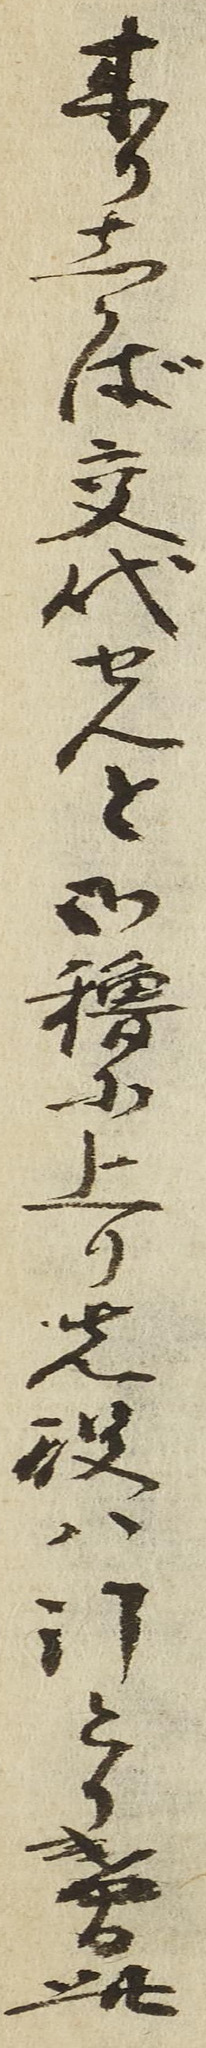来りしかば交代せんと御櫓に上り先般は引とりける此

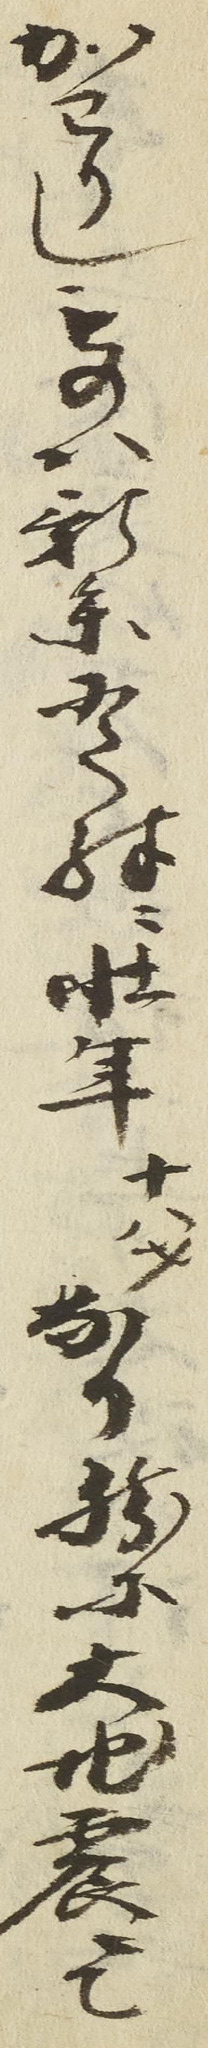かわりしものは新参にて殊ニ壮年十八才なり然に大地震ニて
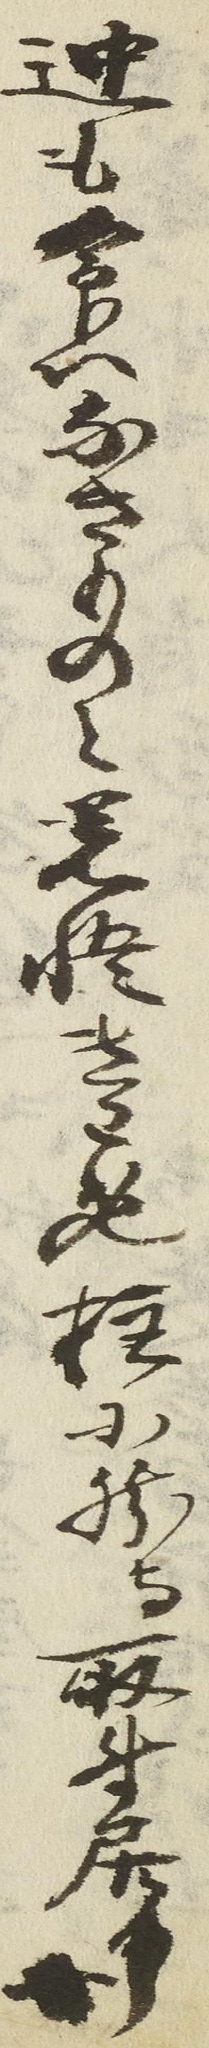迚も命はなきものと覚悟きわめ柱に然与取付居し
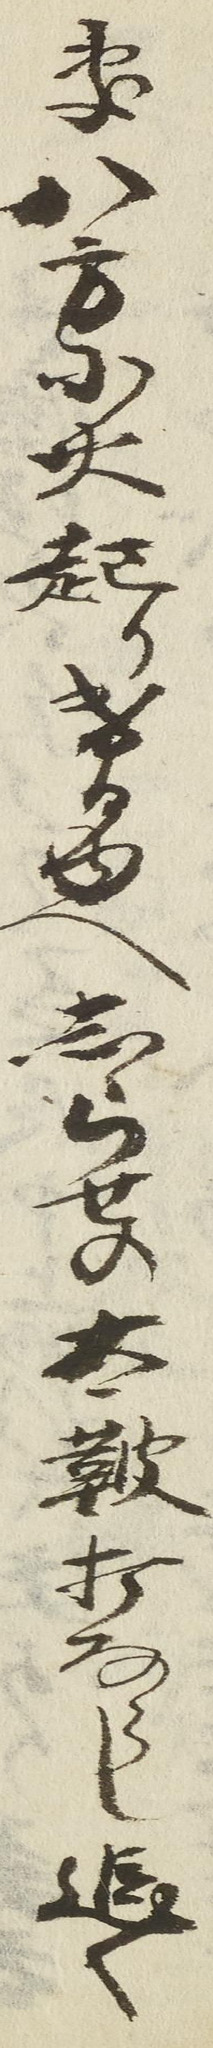処八方に火起りけるゆへしらせの太鼓打ならし追々
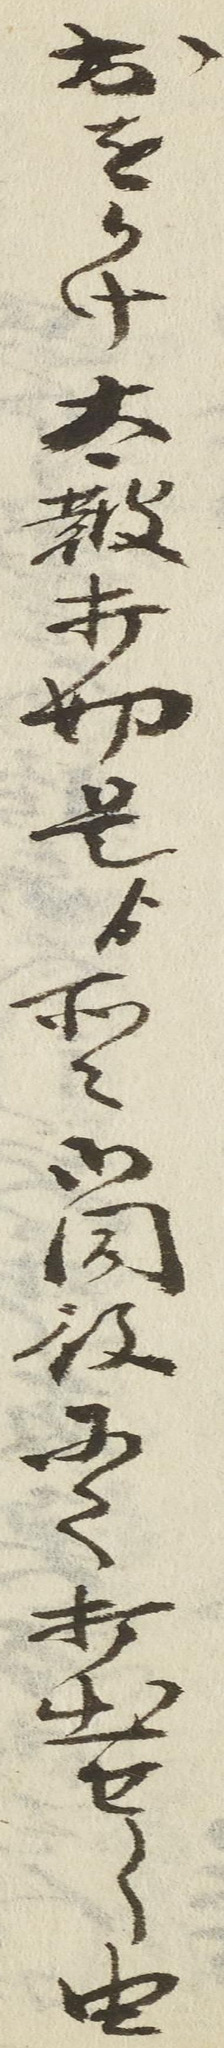おをかけ太鼓打切是ゟ所々御同役にて打出せし由
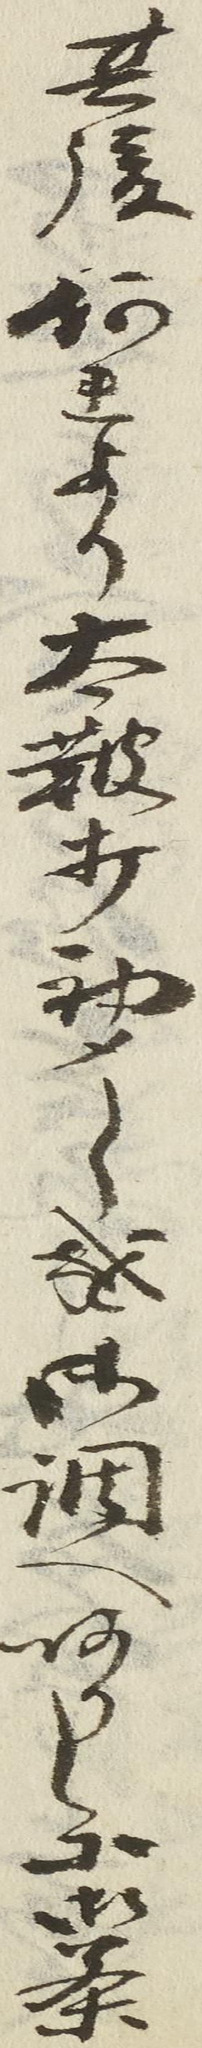其後何れより太鼓打初メし哉御調へありしに御茶
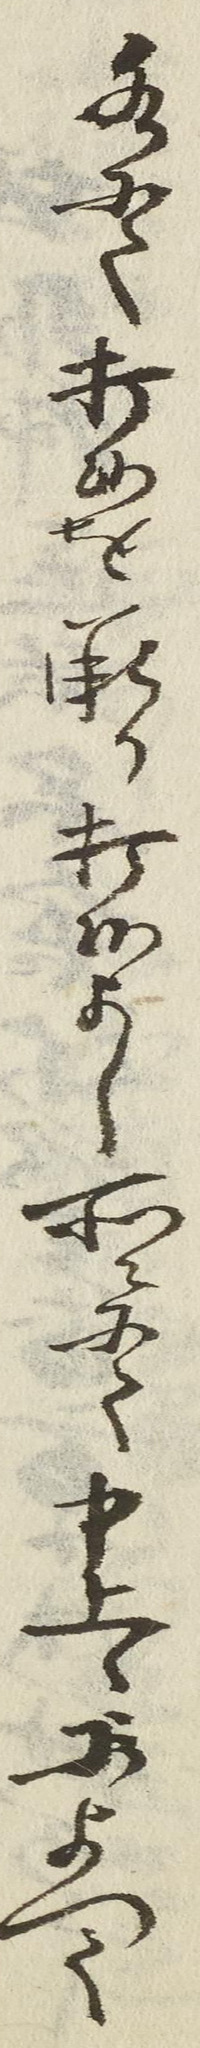水にて打候を承り打候およし所々にて申上候によつて
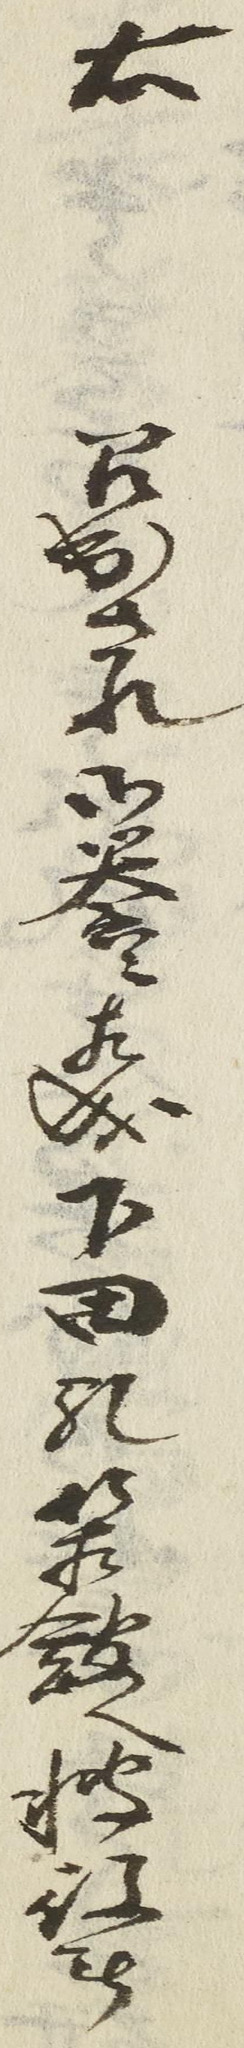右召出され御誉ニ相成下田歟箱館へ転役被
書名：安政二年震災記事　完
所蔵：東京大学地震研究所図書室 Earthquake Research Institute Library, The University of Tokyo, JAPAN
